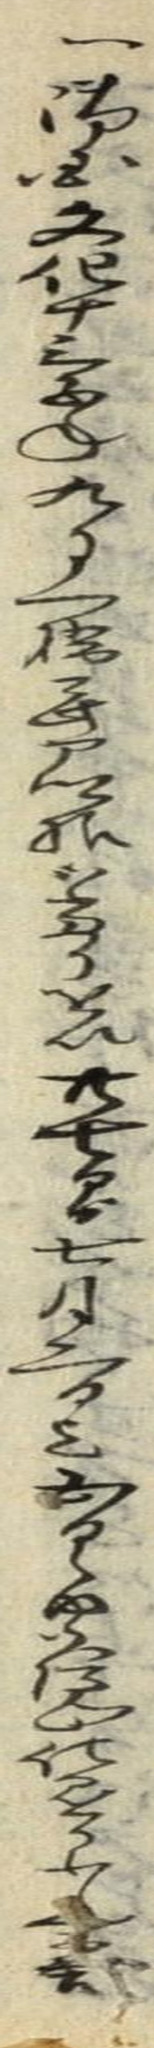一御国文化十三子年九月一橋民部卿様御当りを以廿七日ゟ七月二日迄五日之内御停止仕懸りふしん不苦
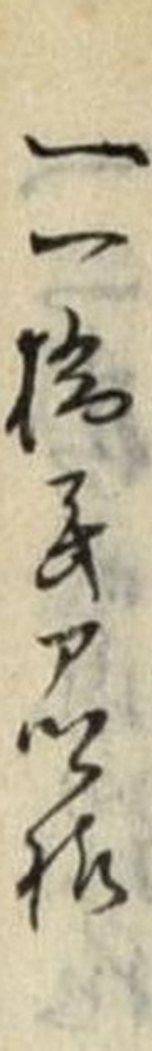一一橋民部卿様
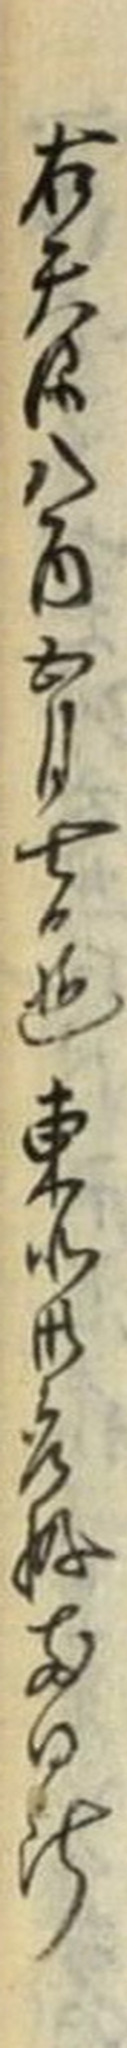右天保八酉五月七日逝東北御取扱前同断
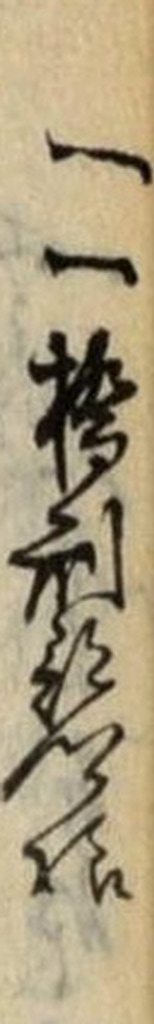一一橋刑部卿様
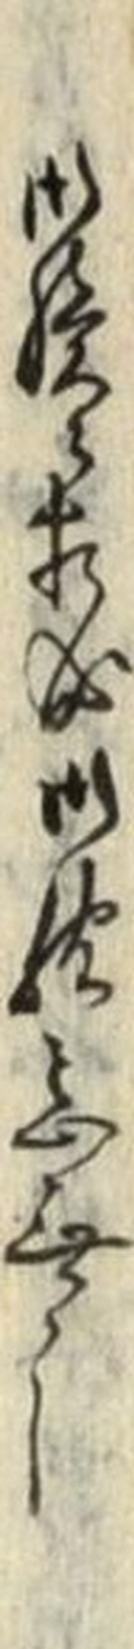御続に相成御服忌無之
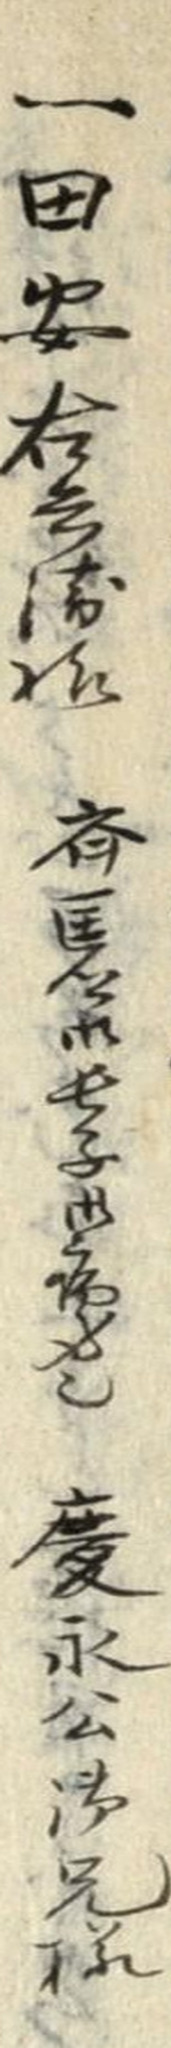一田安右兵衛様斉匡卿長子御病身也慶永公御兄様
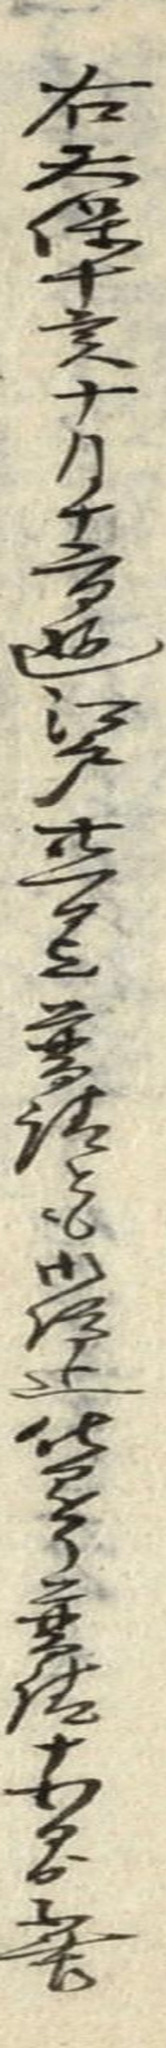右天保十亥十月十二日逝江戸廿一日迄普請とも御停止仕懸り普請十五日ゟ不苦
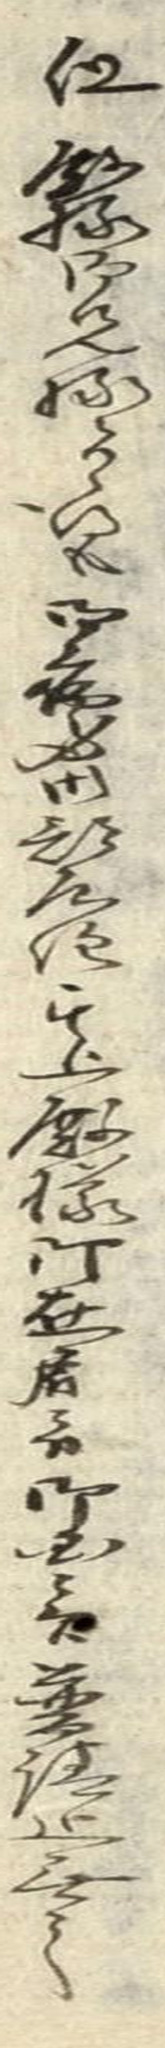但殿様御兄様には候得共御病身御部屋住其上殿様御在府に付御国にては普請止無之
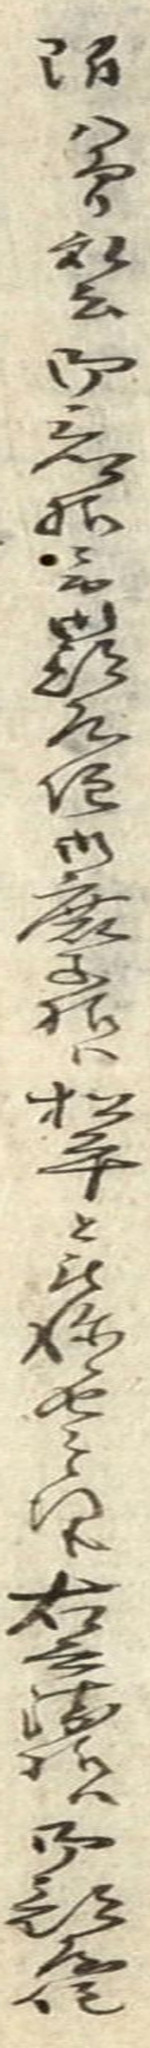附ハ百り乱云御三卿様にて御部屋住御庶子様は松平と被称候由に候得共右兵衛様は御部屋住
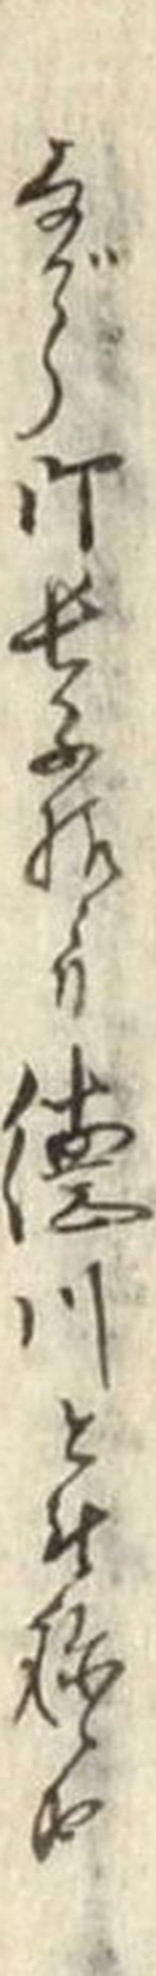ながら御長子様に付徳川と被称候由
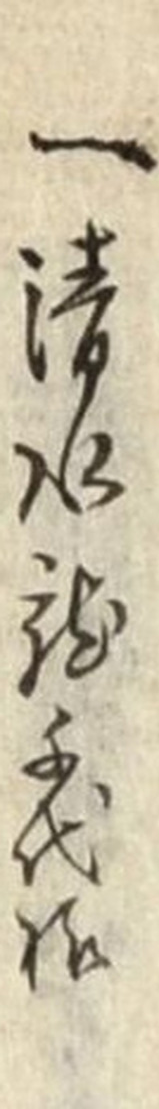一清水龍千代様
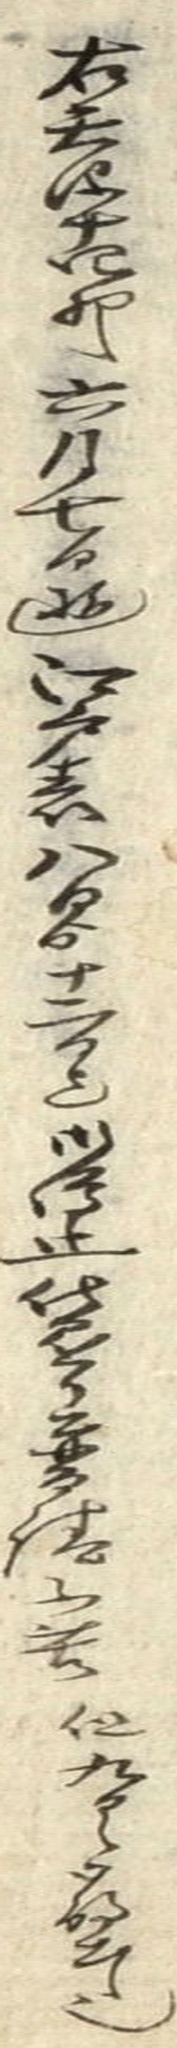右天保十四卯六月七日逝江戸表八日ゟ十二日迄御停止仕懸り普請不苦但九日御触出候也
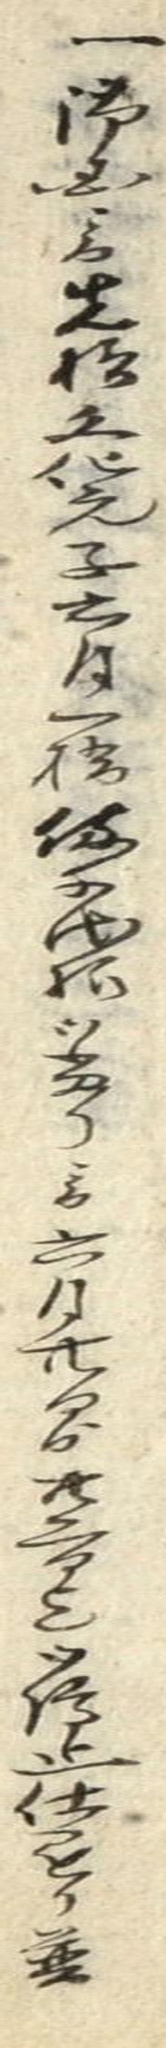一御国にて先格文化元子六月一橋備千代様御当りにて六月廿日ゟ廿二日迄御停止仕懸り普請不苦
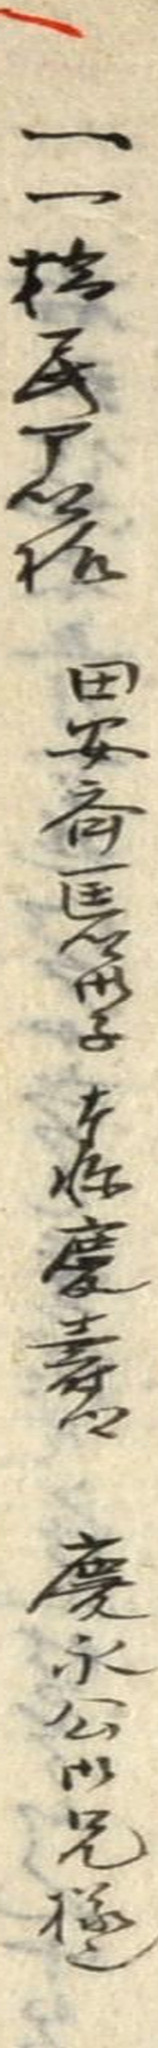一一橋民部卿様田安斉匡卿御子奉称慶寿卿慶永公御兄様也
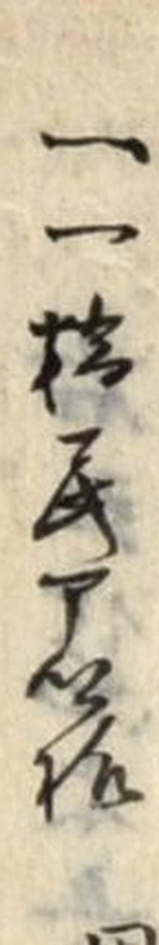一一橋民部卿様

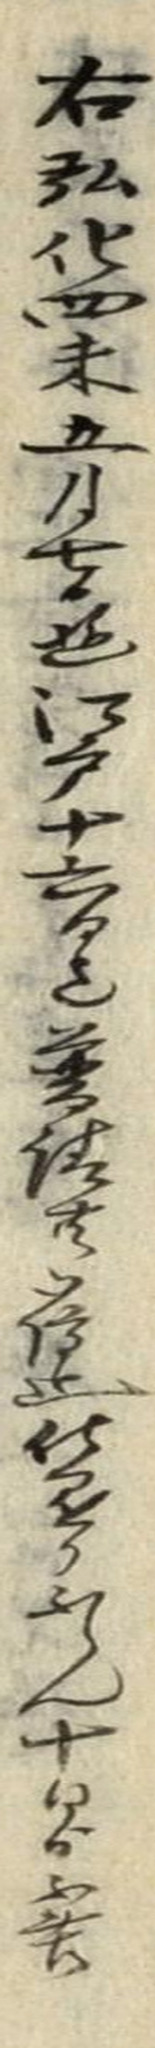右弘化四未五月七日逝江戸十六日迄普請共御停止仕懸りふしん十日ゟ不苦
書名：御停止異変死失
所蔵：福井県文書館 Fukui Prefectural Archives
